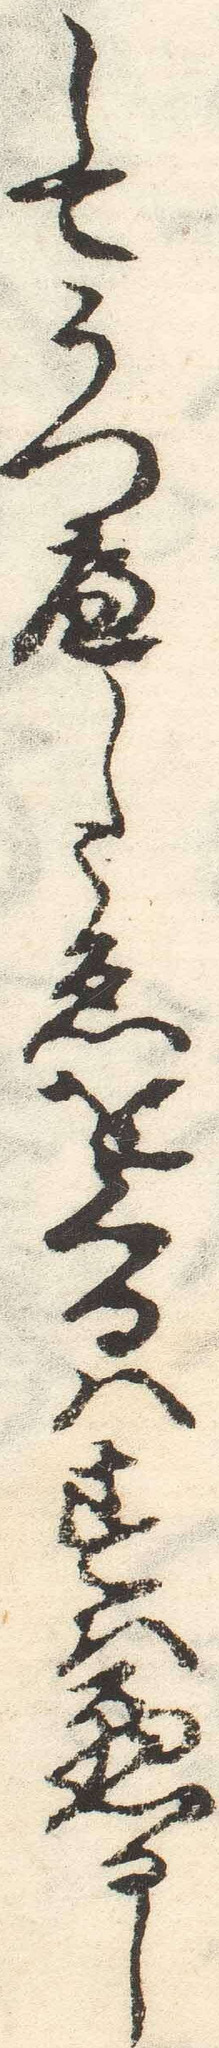してうつへしこゑをくるはすは悪るし
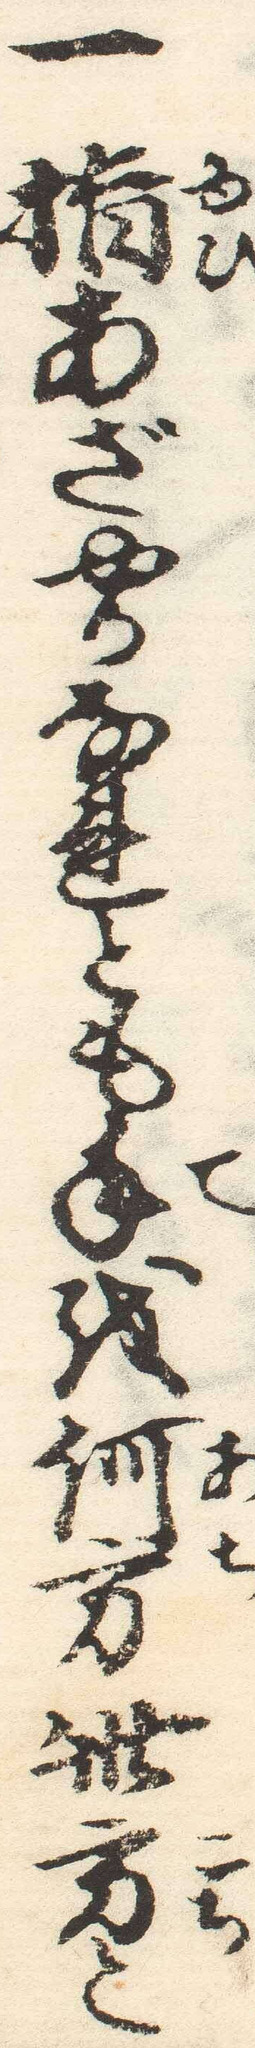一指あざやかなれとも手を何方此方と
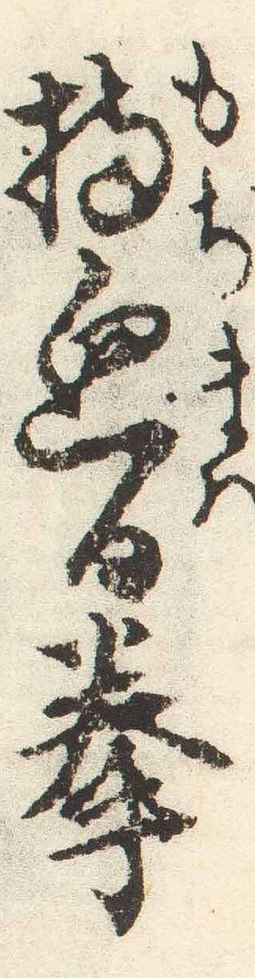持廻る拳
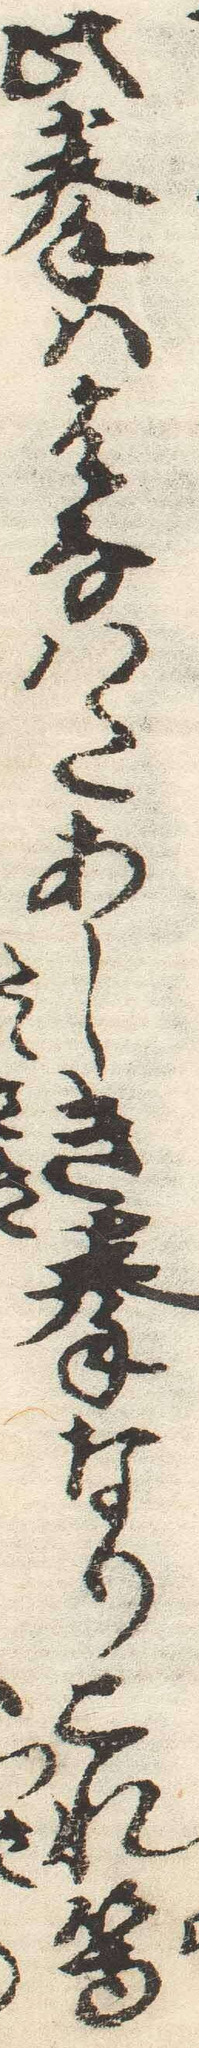此拳ははなはたあしき拳なりこれ等
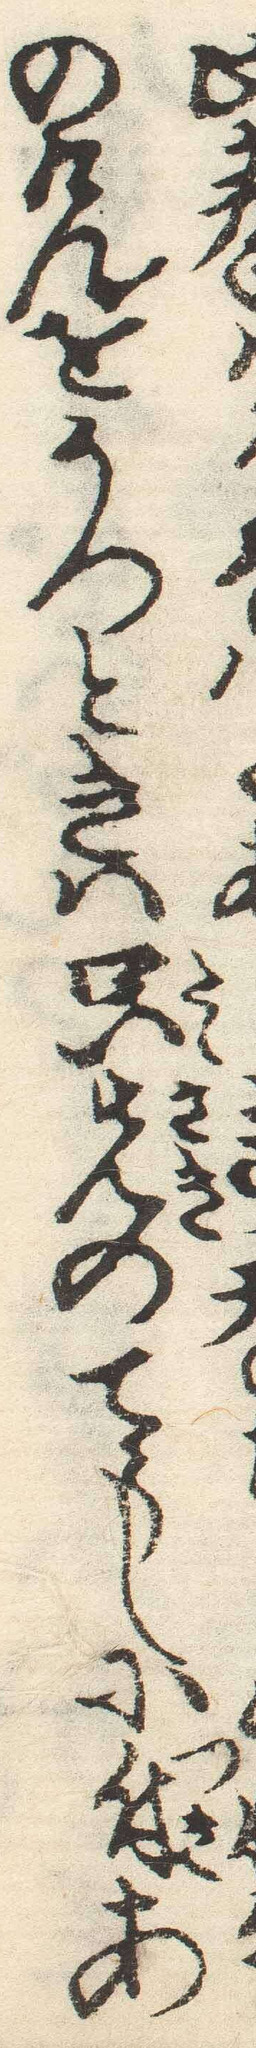のけんをうつときは只先のてうしに付あ

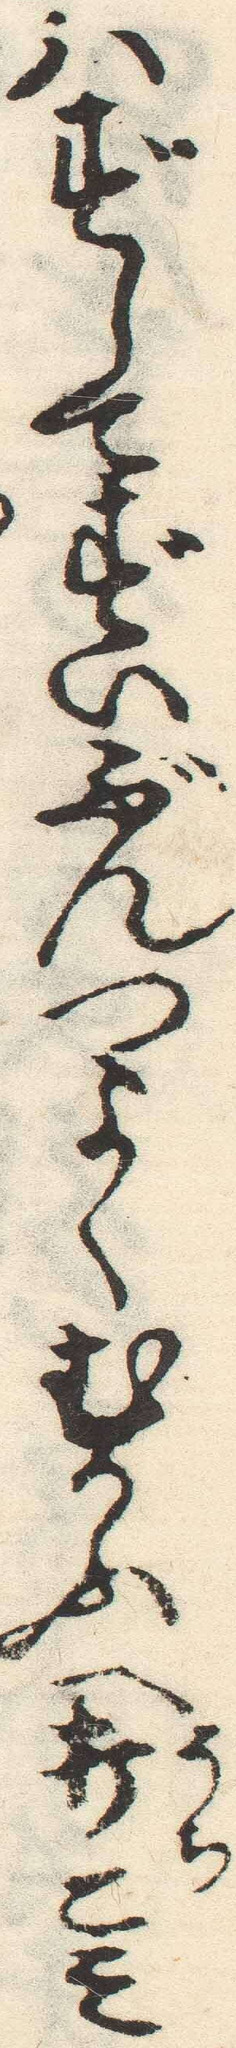はずしてずいぶんつよくむかふへ打こみ
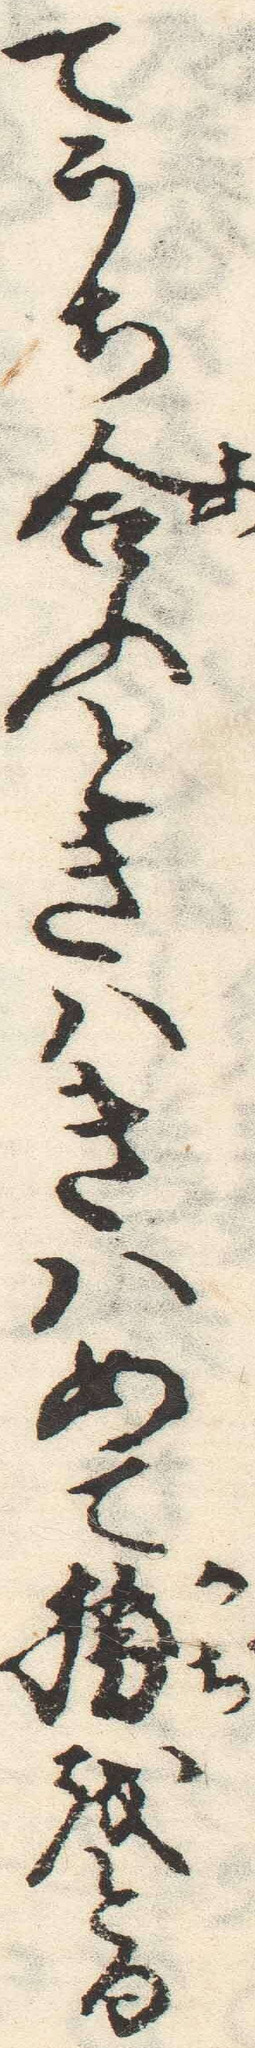てうち合ふときはきはめて勝をとる
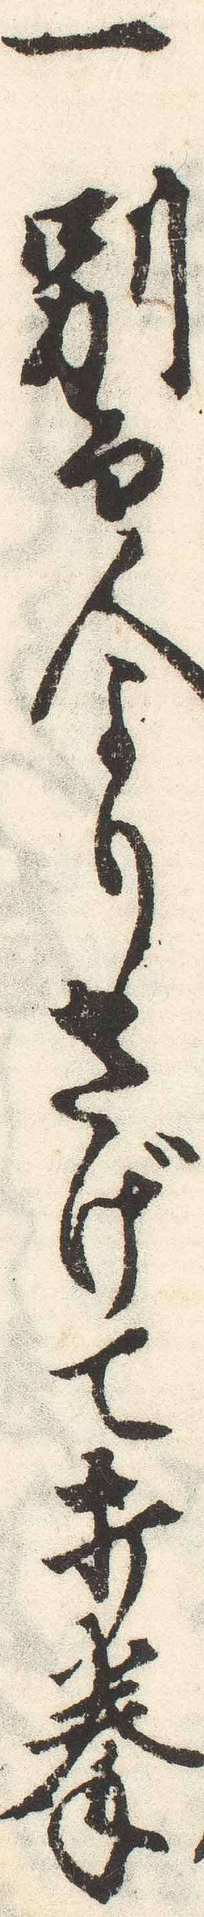一別而人よりさげて打拳
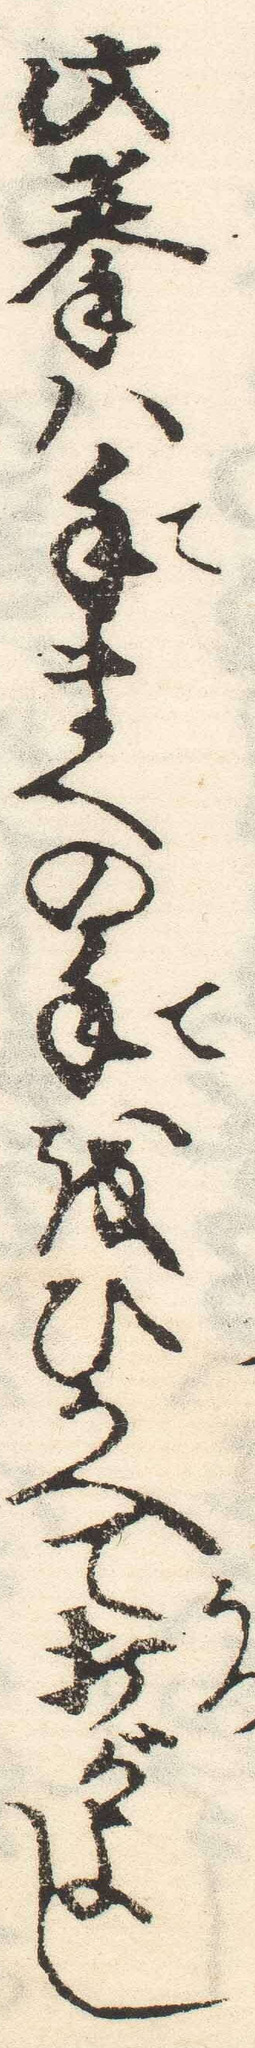此拳は手まへの手をひかへて打がよし
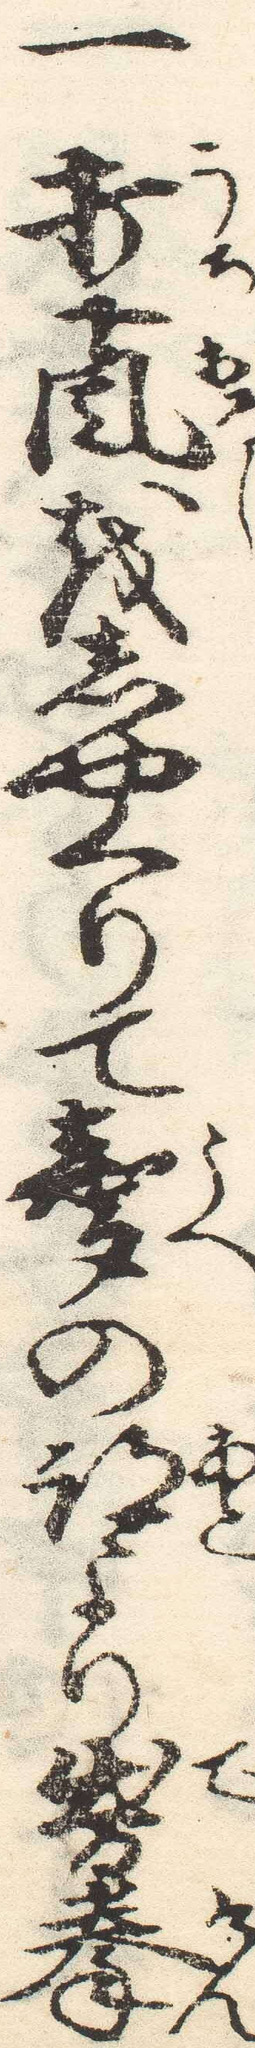一打颪をしやくりて声の跡より出る拳
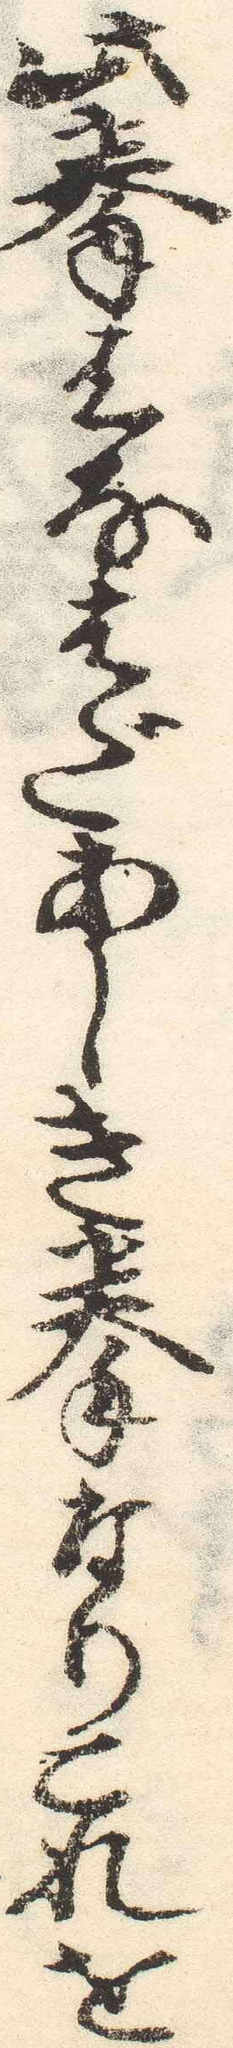此拳はなはだあしき拳なりこれを
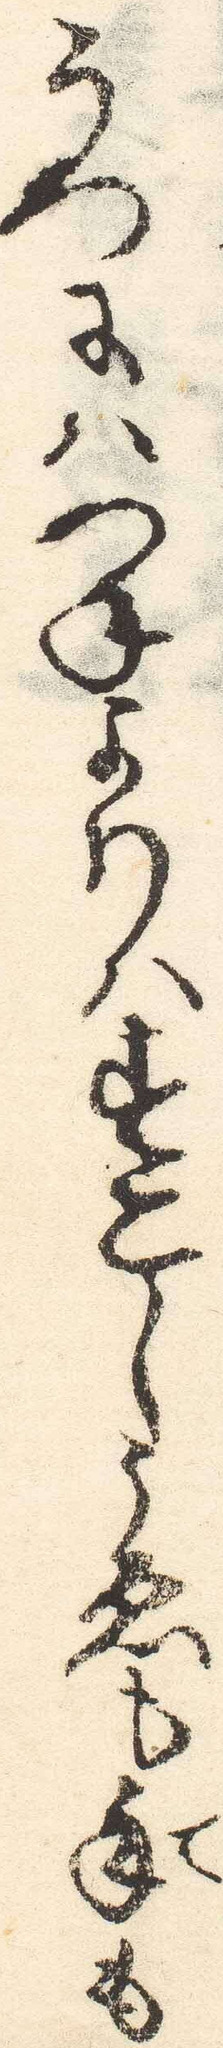うつにはつねよりはすこしこゑも手も
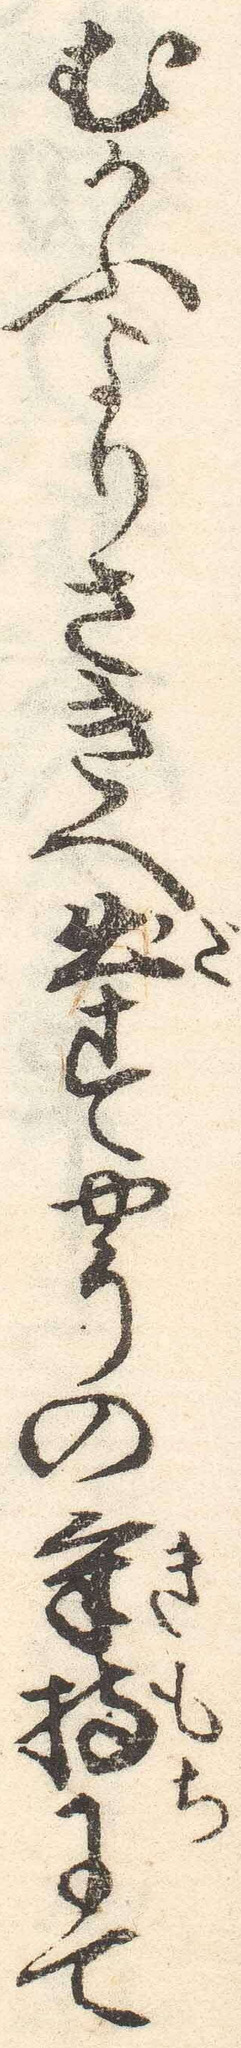むかふよりさきへ出すやうの気持にて
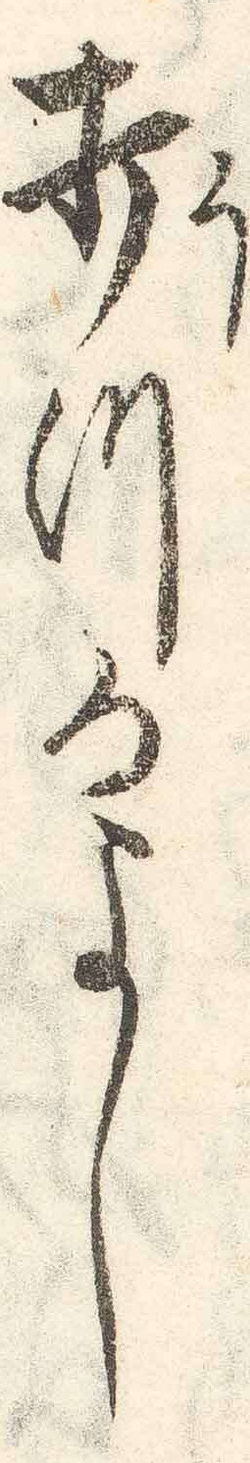打つかよし
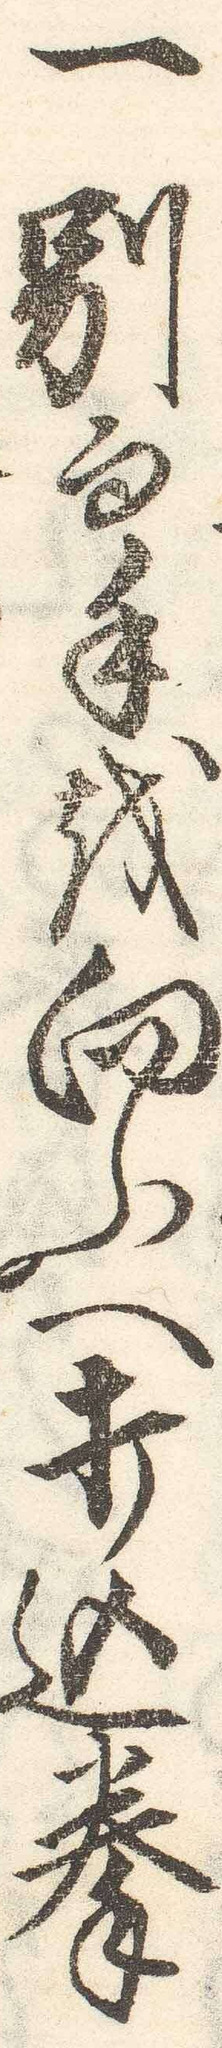一別而手を向ふへ打込拳
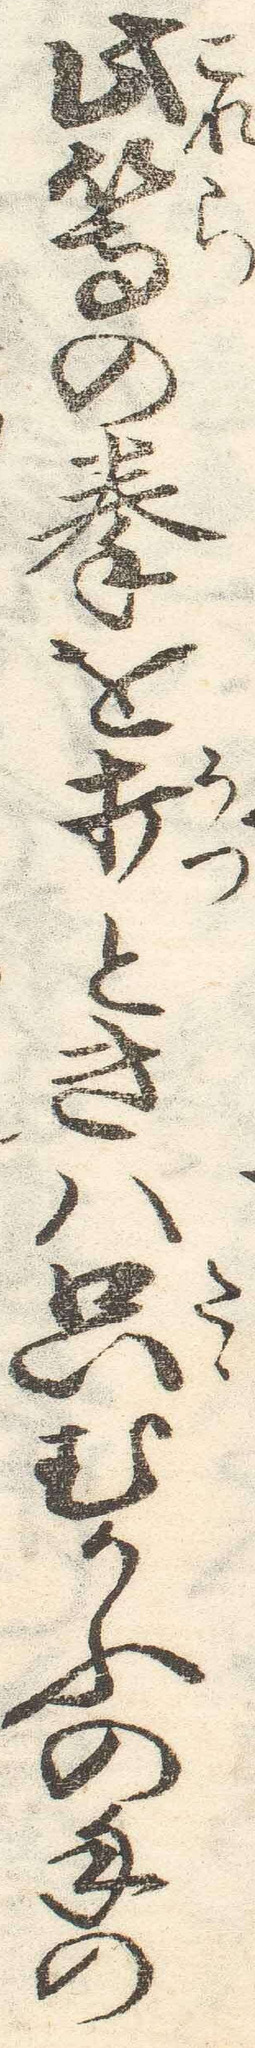此等の拳を打ときは只むかふの手の
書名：拳独稽古
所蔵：東京学芸大学附属図書館 国文学研究資料館
